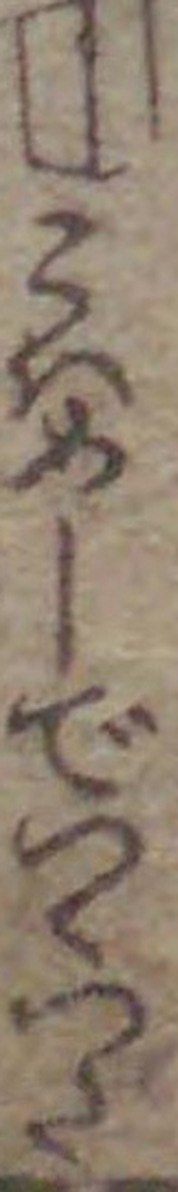こはめしでつくつた
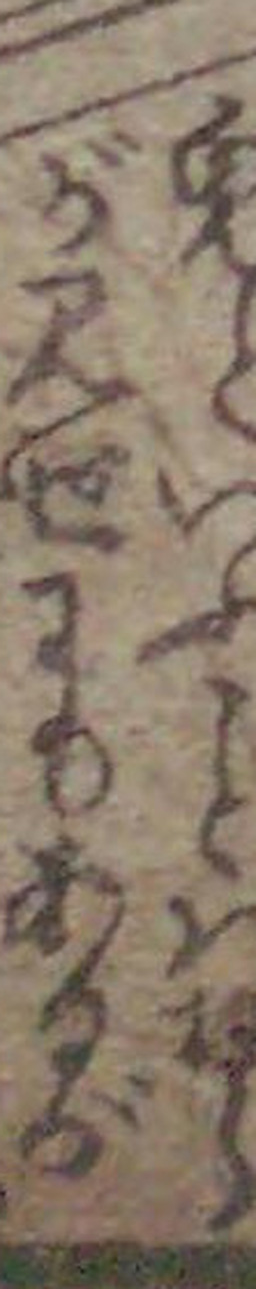が見世にもあるが
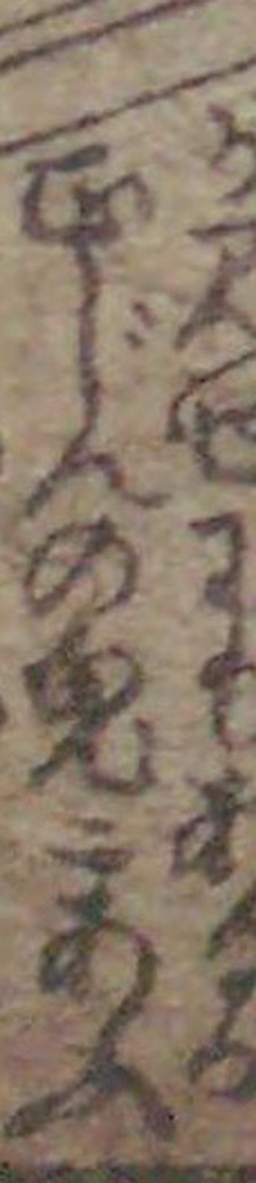正じんの鬼にあふ
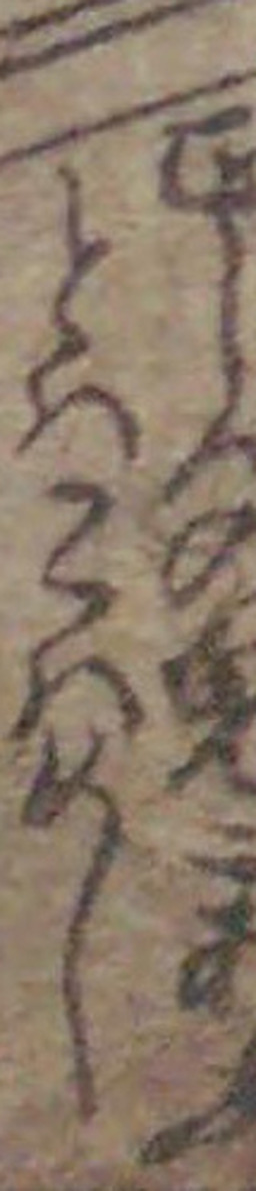とはこはめし
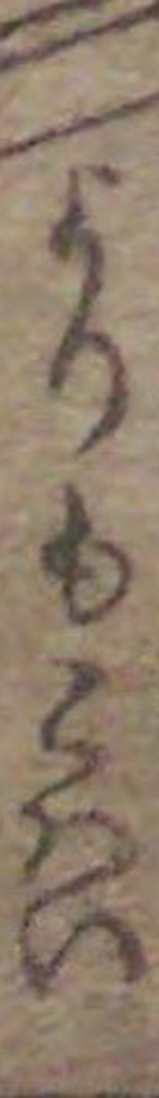よりもこはい

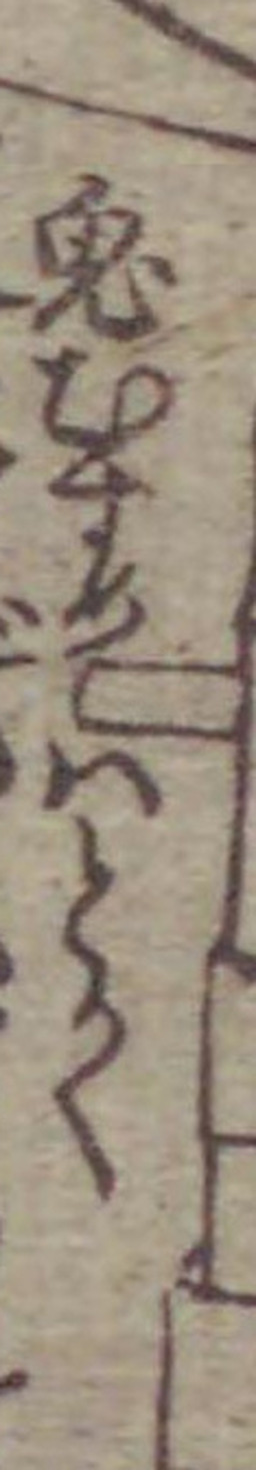鬼むすめはとかく
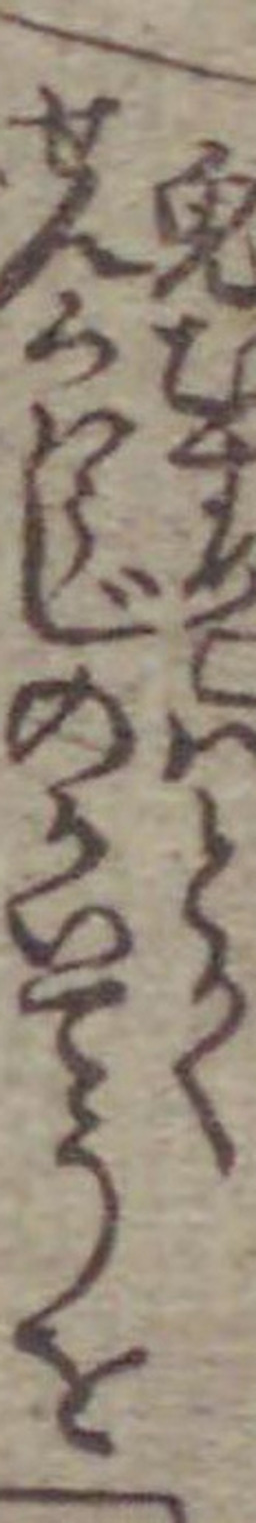せんくはうじのかいてうを
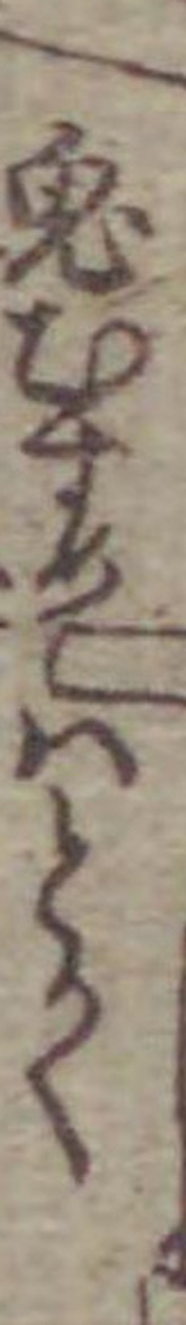鬼むすめはとかく
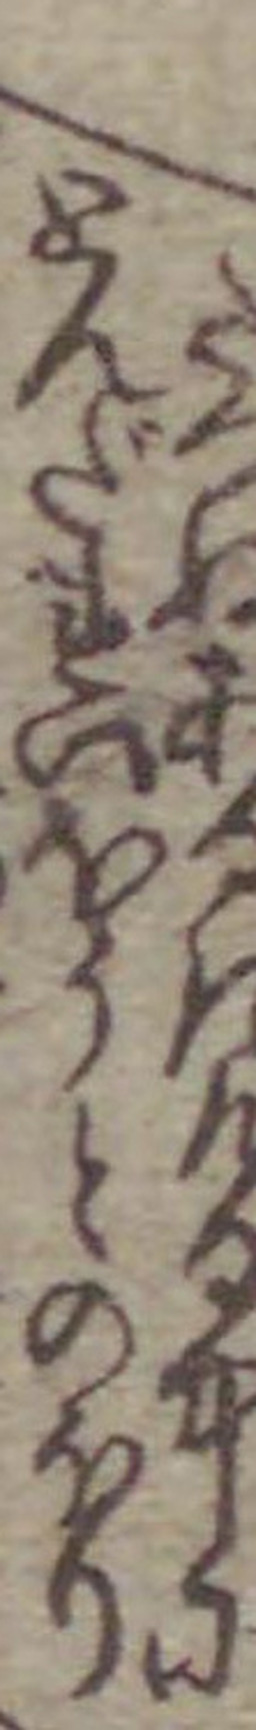とんだれいほうとのほり
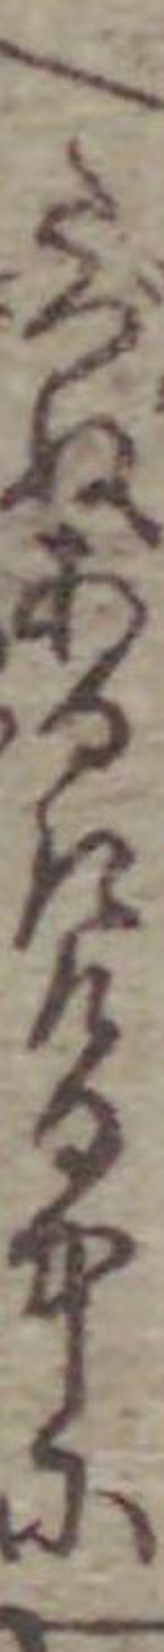たづねあるきける中に
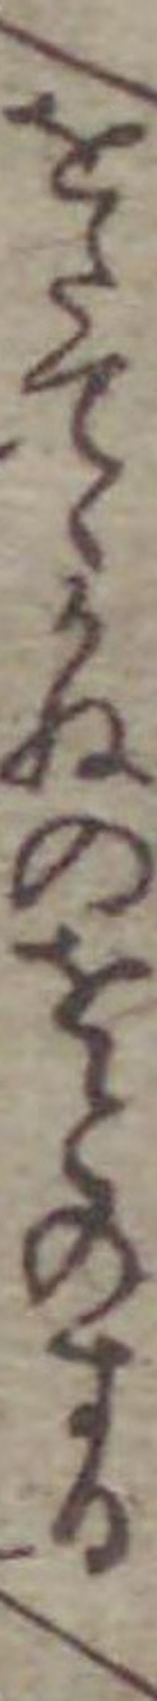をたてゝかねのおとのする
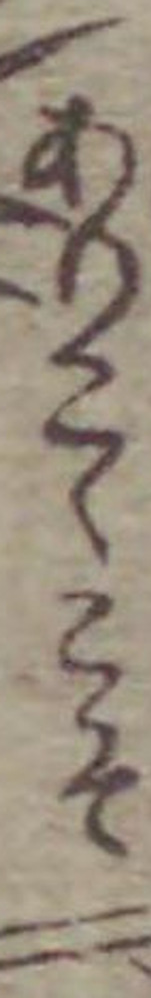ありこゝこそ
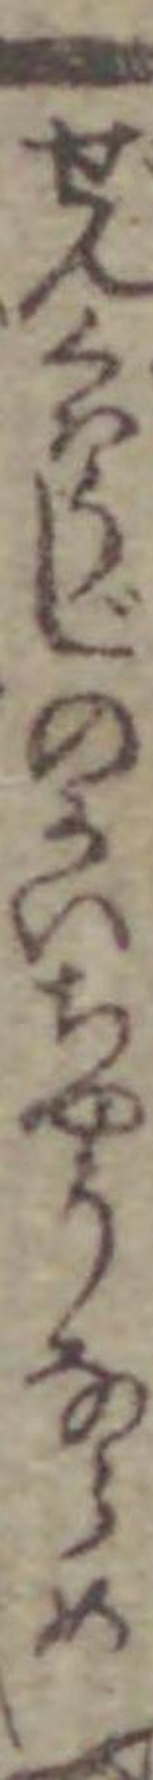ぜんくはうじのかいちやうならめ
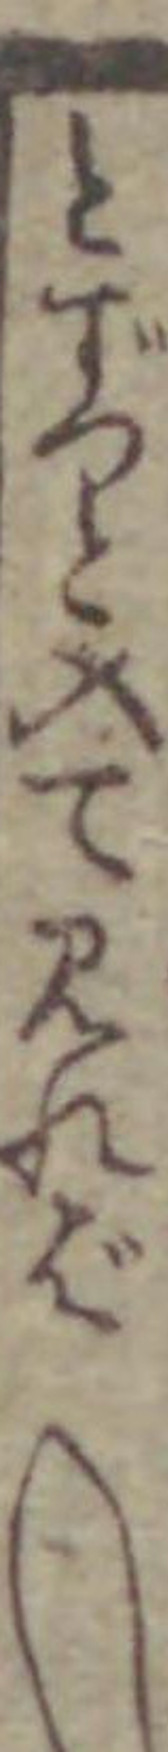とずつと入て見れば
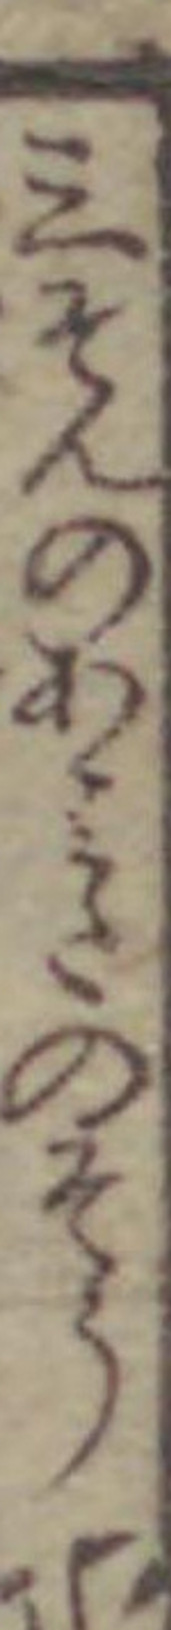三そんのあみたのそう
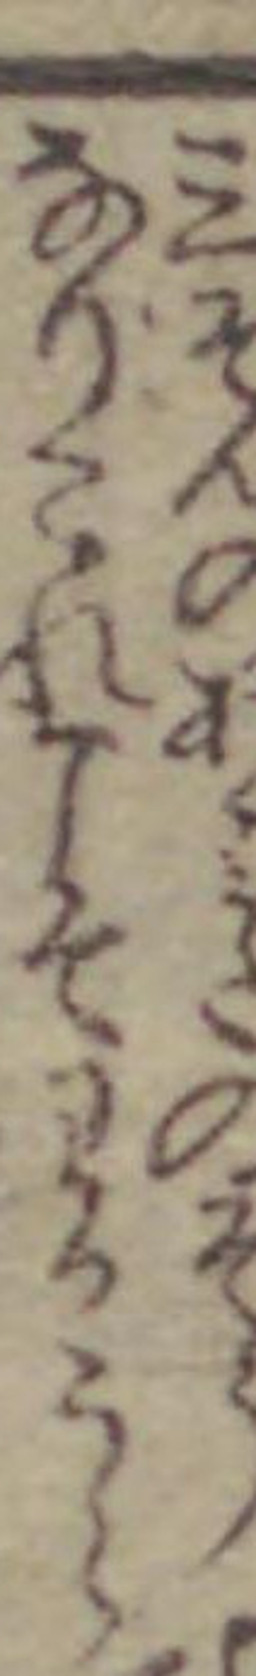なりこれこそわかうら
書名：鬼の趣向草 2巻
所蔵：国立国会図書館 National Diet Library, JAPAN
